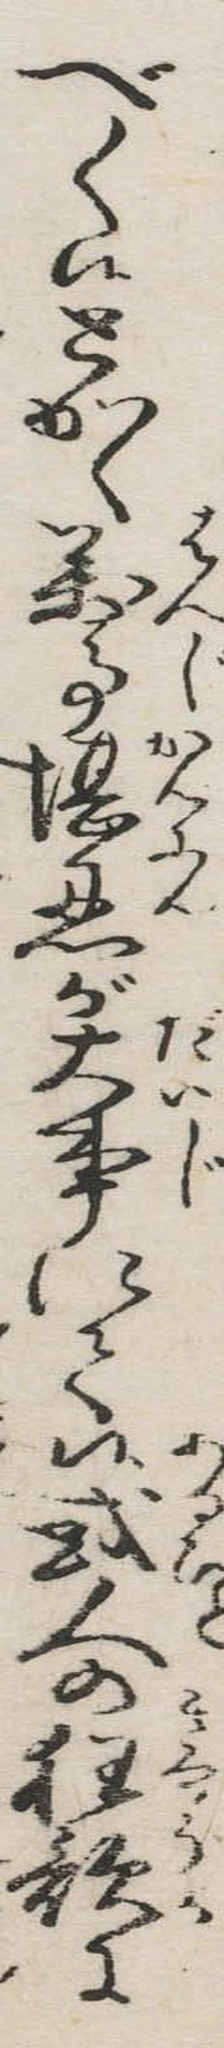べく候とかく万事堪忍が大事にて候或人の狂歌に
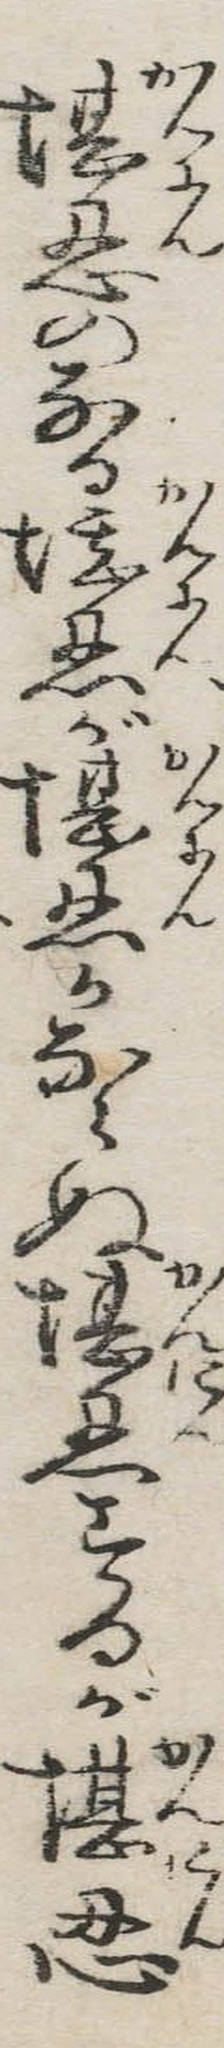堪忍のなる堪忍が堪忍かならぬ堪忍するが堪忍
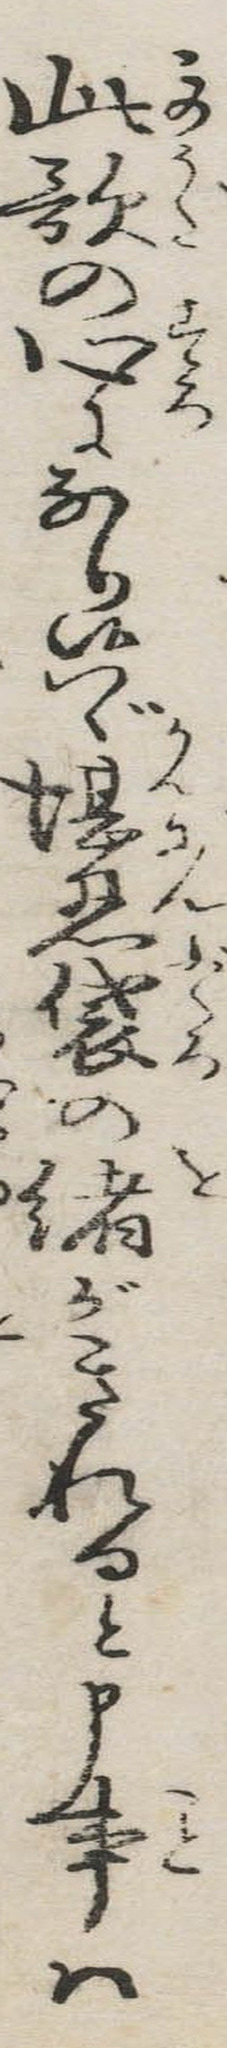此歌の心になり候はゞ堪忍袋の緒がきれると申事は
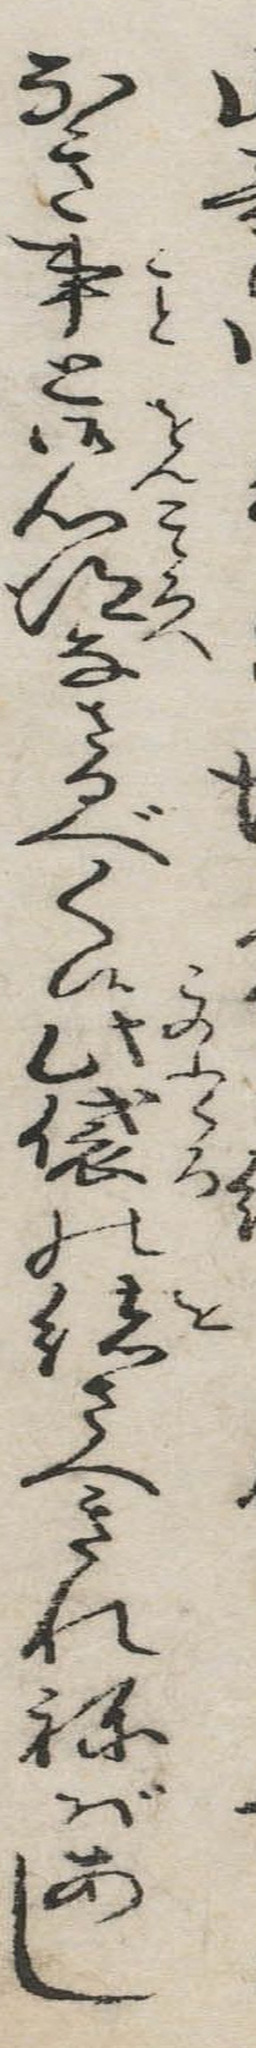なき事と御心得なさるべく候此袋の緒さへきれねばあし
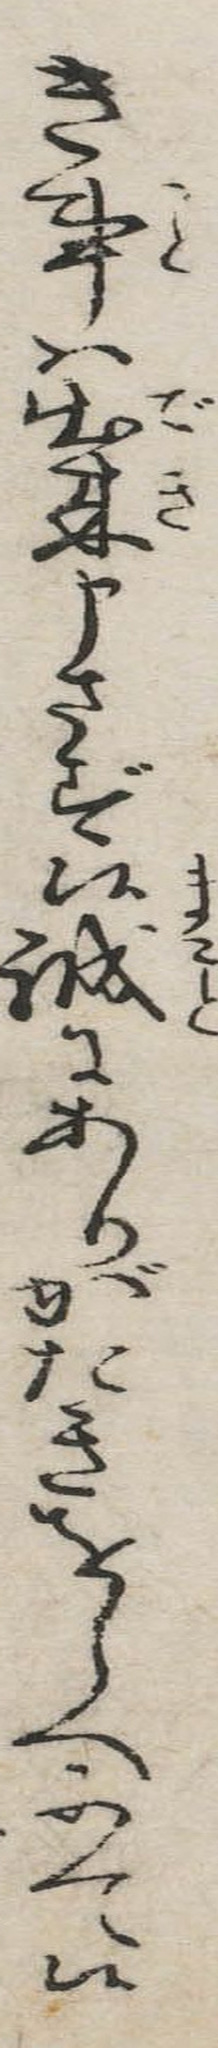き事は出来申さず候誠にありがたきをしへにて候
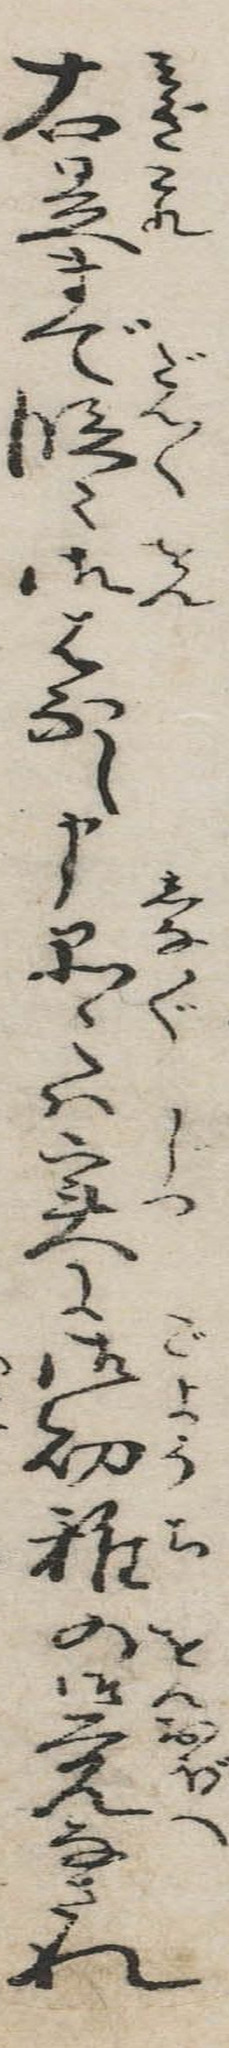右是まで段々御はなし申品々は実に御幼稚の御覚なされ
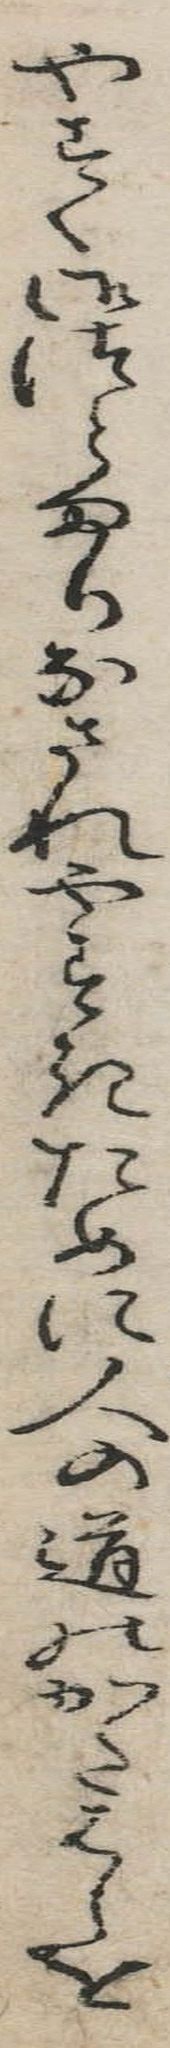やすく御つとまりなされやすきために人の道のかたはしを

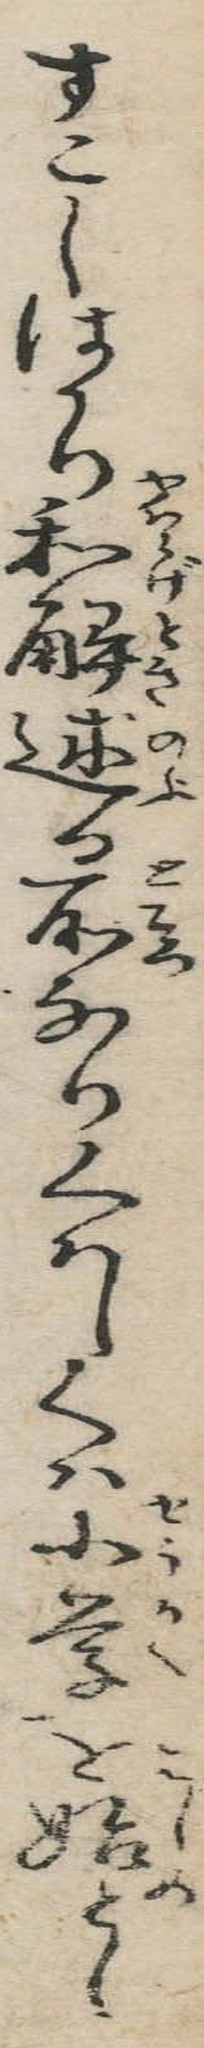すこしはかり和解術る所なりくはしくは小学を始とし
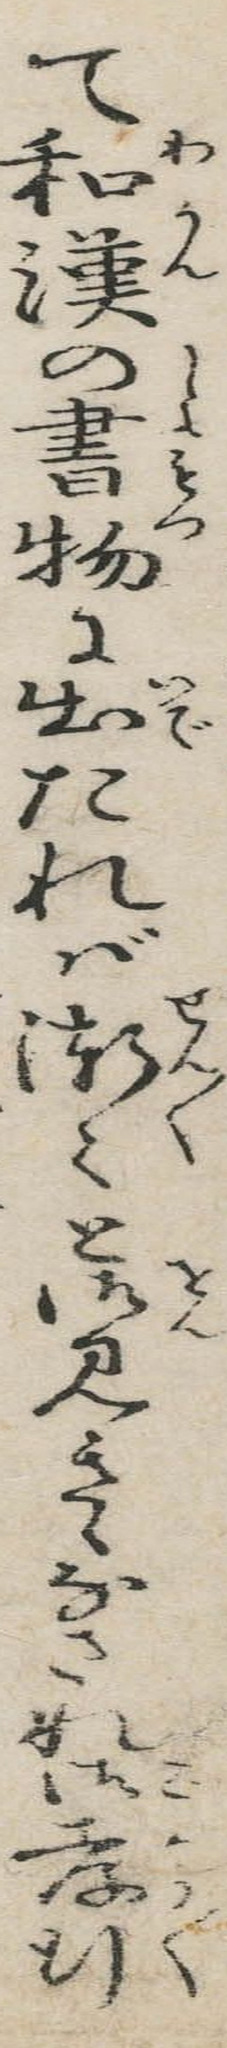て和漢の書物に出たれば漸々と御見きゝなされ御孝行
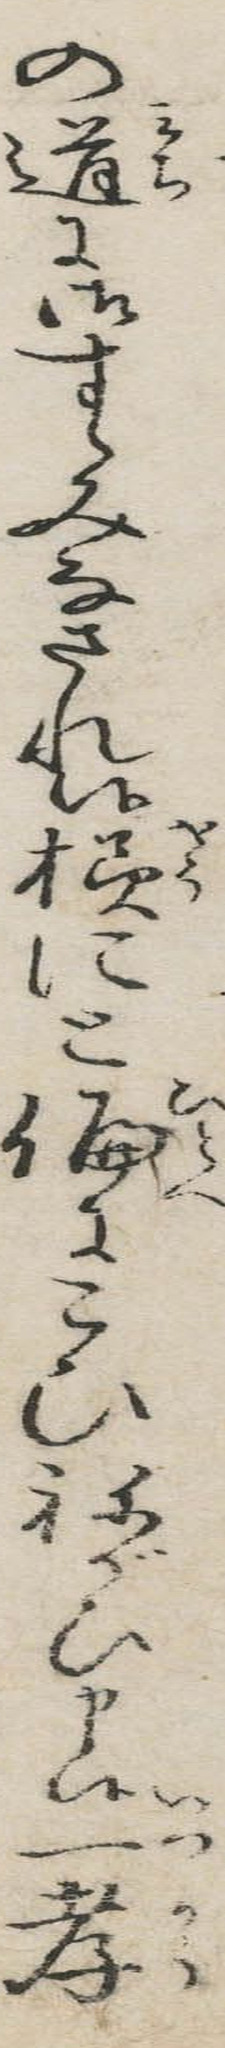の道に御すゝみなされ候様にと偏にこひねがひ申候一孝
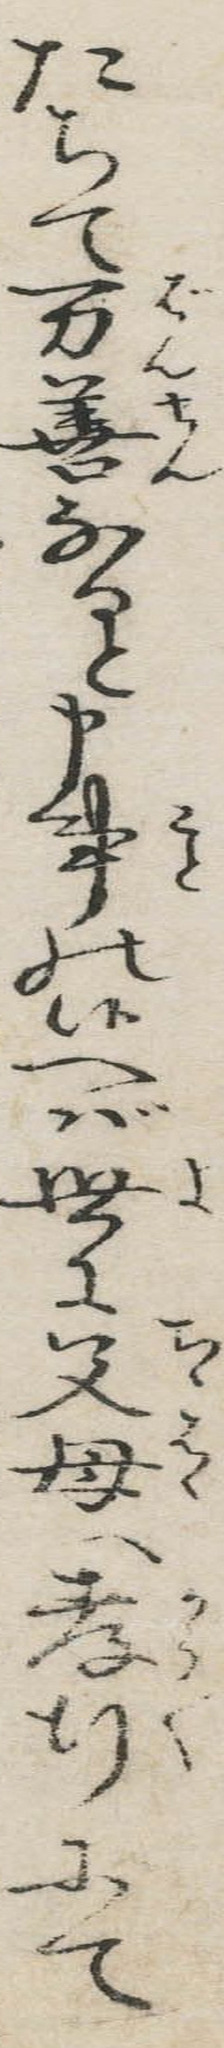たちて万善なると申事の候へば世に父母へ孝行にて
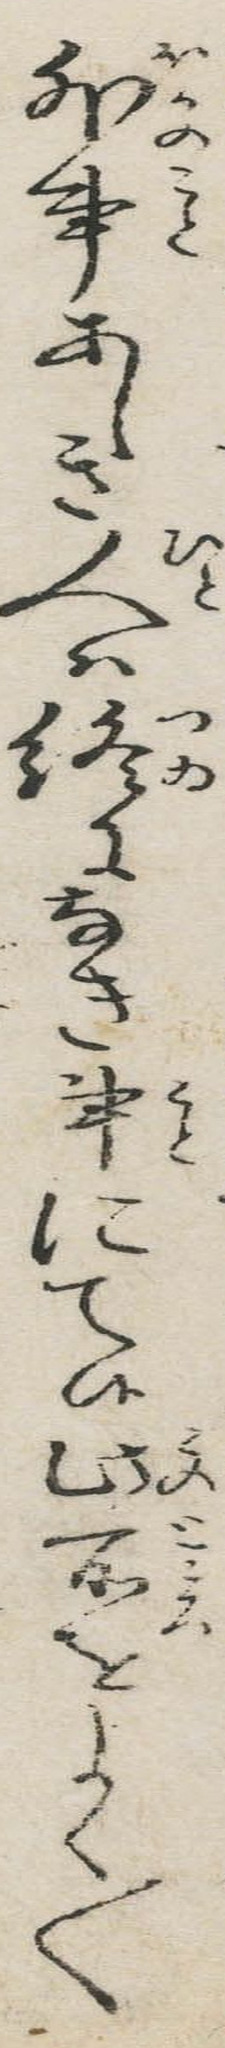外事あしき人は終になき事にて候此所をよく〳〵
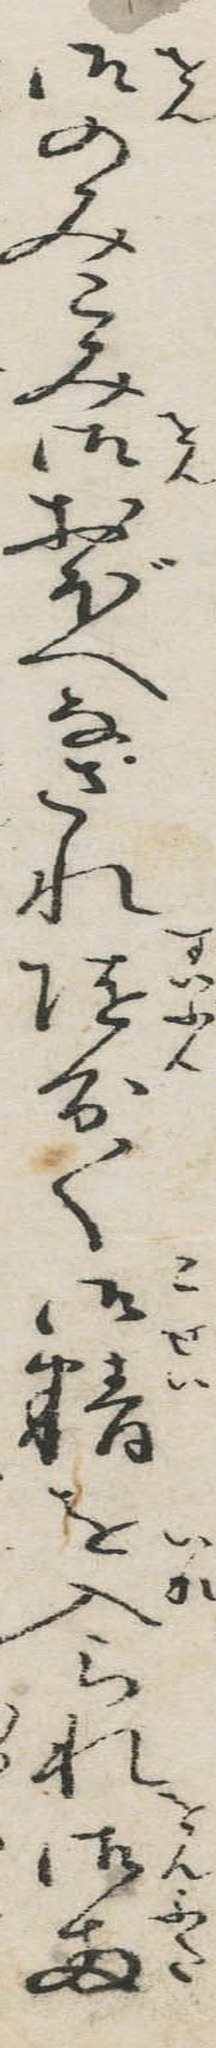御のみこみ御おぼへなされ随分〳〵御正精を入られ御両
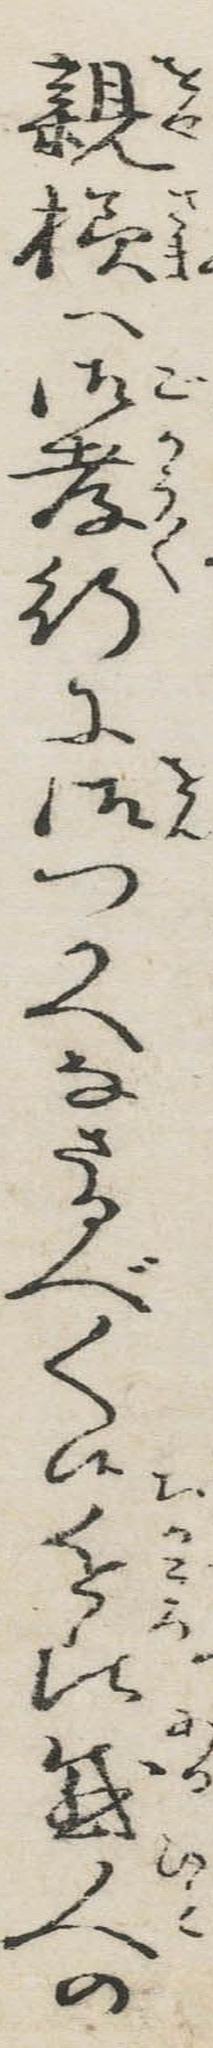親様へ御孝行に御つかへなさるべく候近頃或人の
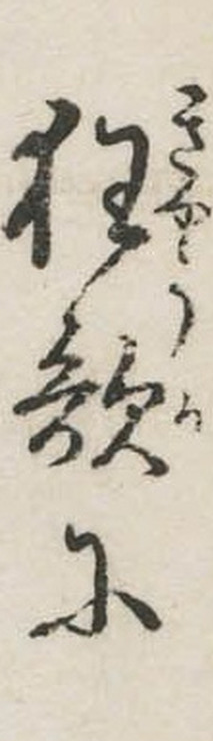狂歌に
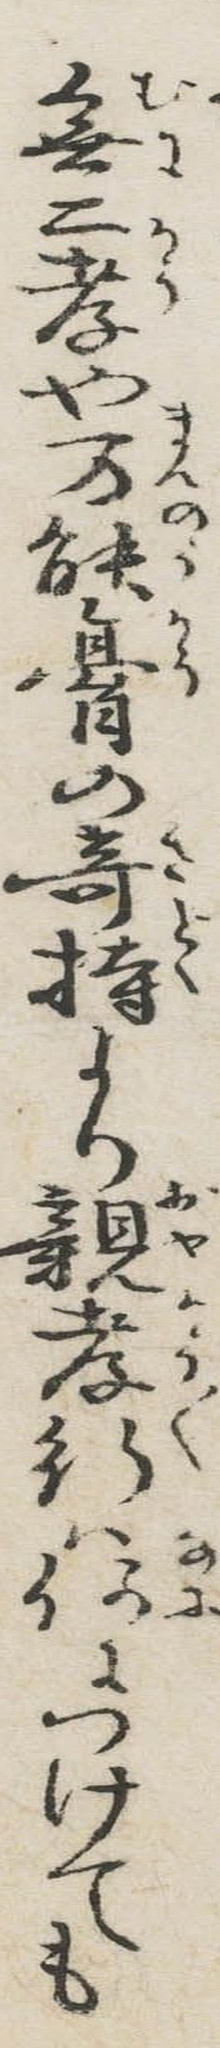無二孝や万能膏の奇特より親孝行は何につけても
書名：前訓
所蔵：東京学芸大学附属図書館
